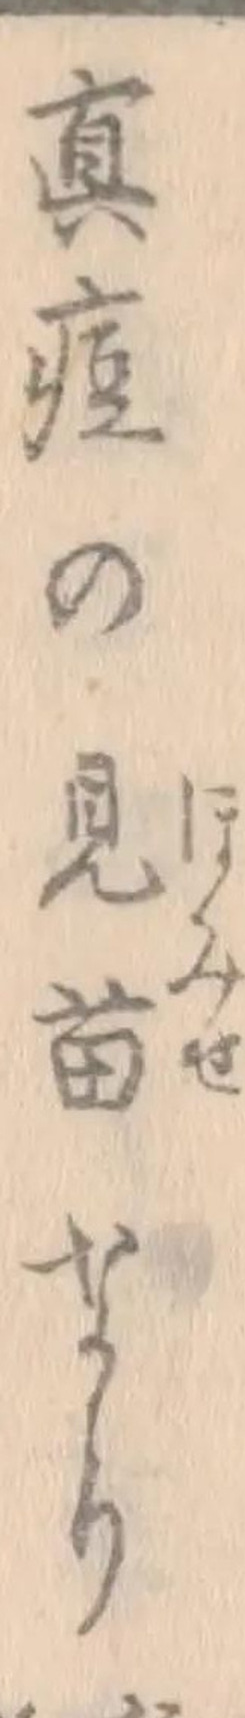真痘の見苗なり
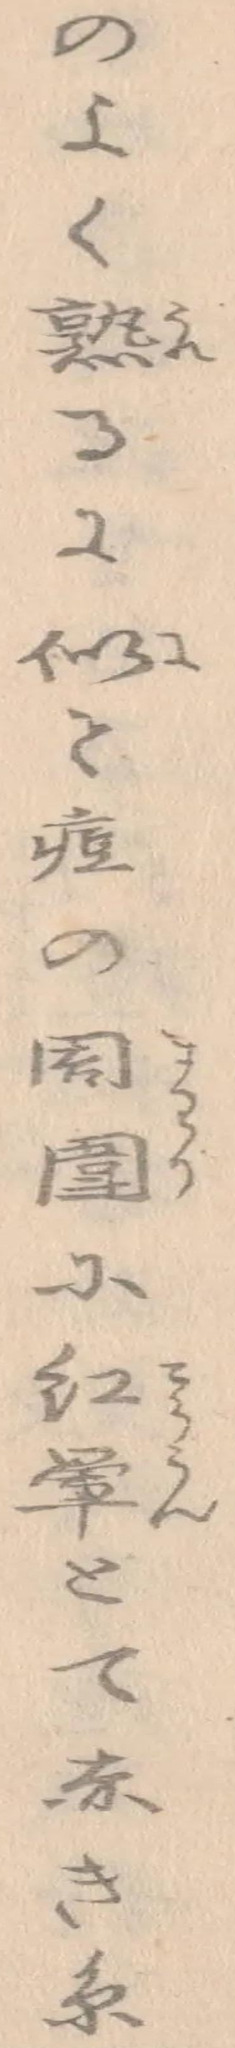のよく熟るに似て痘の周囲に紅単とれ赤き糸
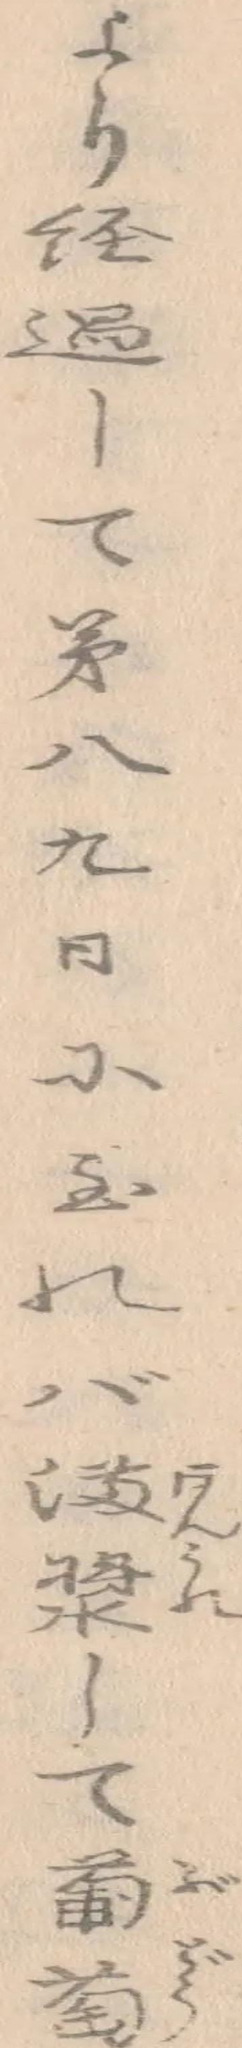より経過して第八区日に至れば満漿して葡萄
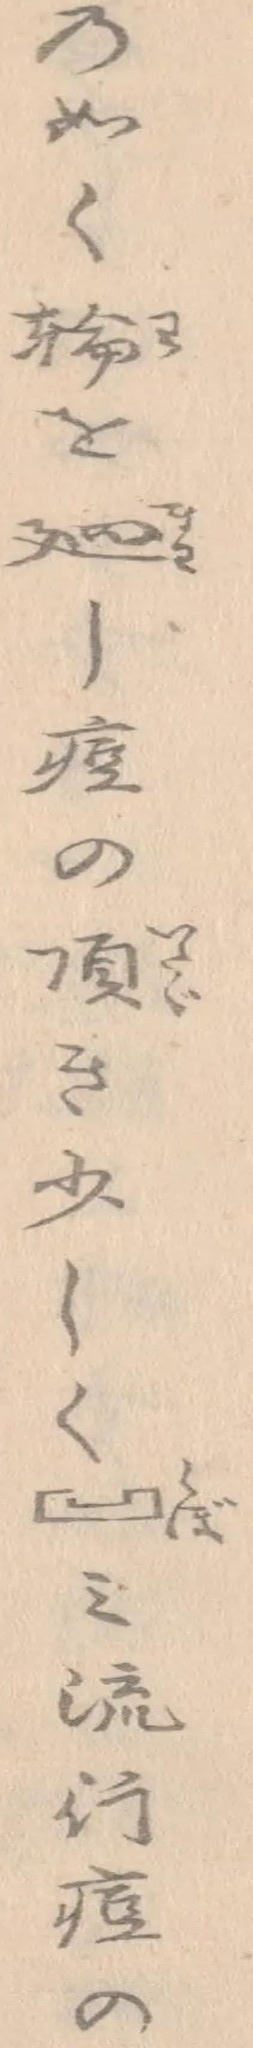の如く輪を廻し痘の頂き少し凹み流行痘の
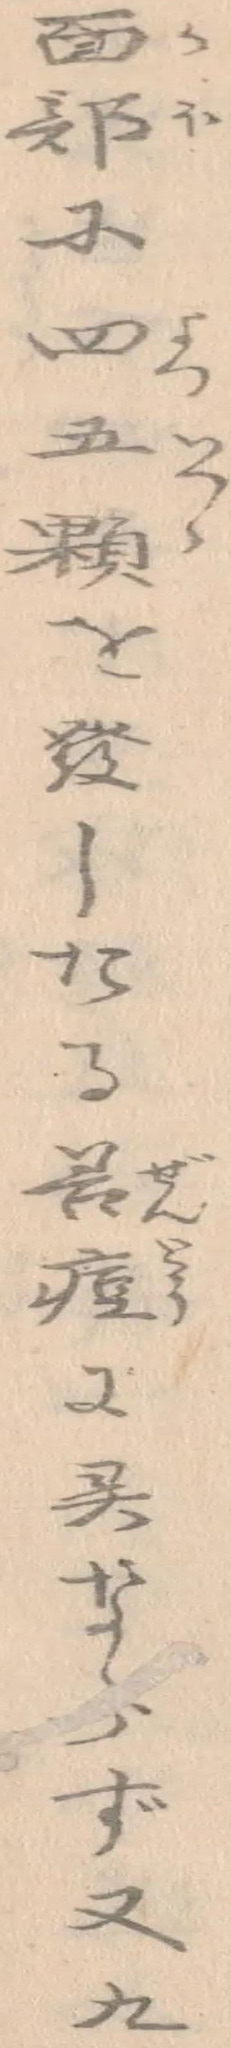面部に四五顆を発したる善痘に異ならず又九
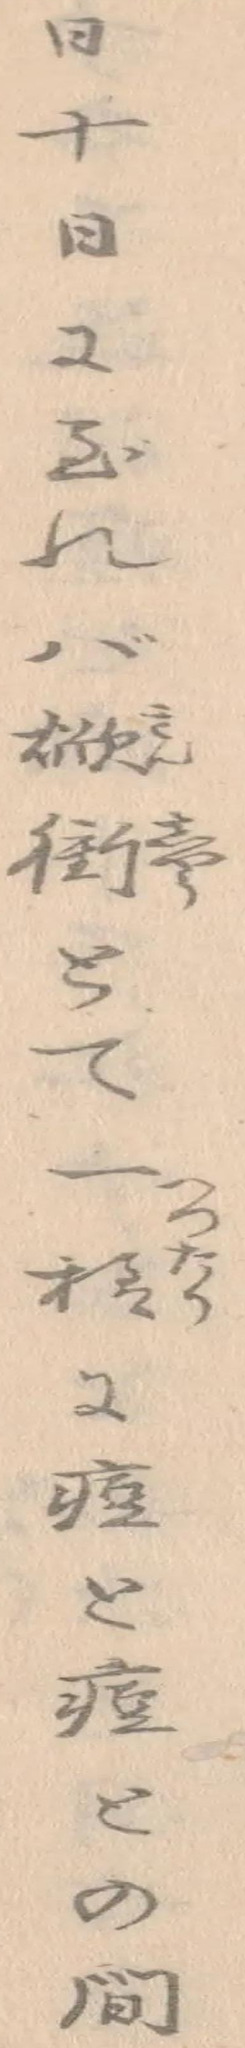日十日に至れば掀衝とて一様に痘と痘との間
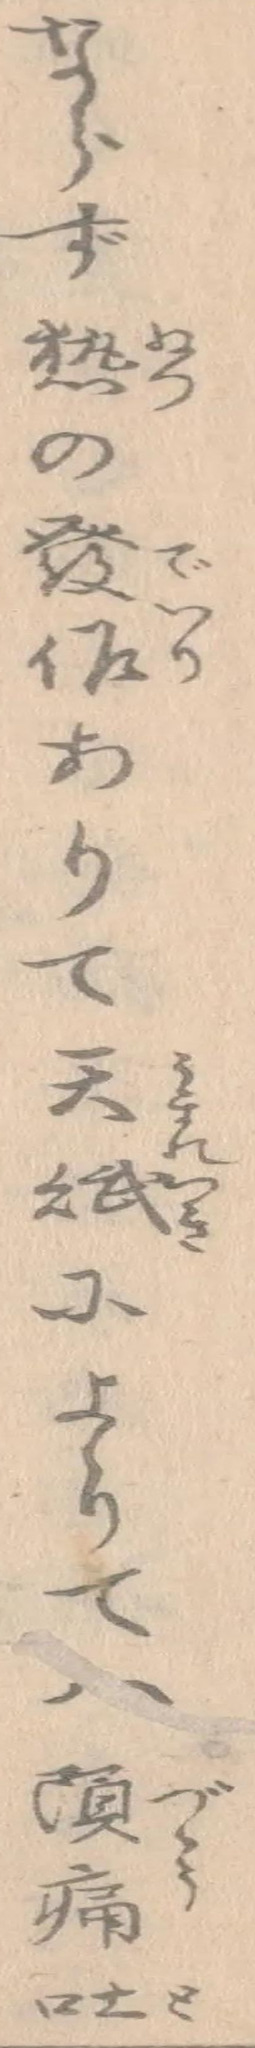ならず熱の発作ありて天紙によりては頭痛吐
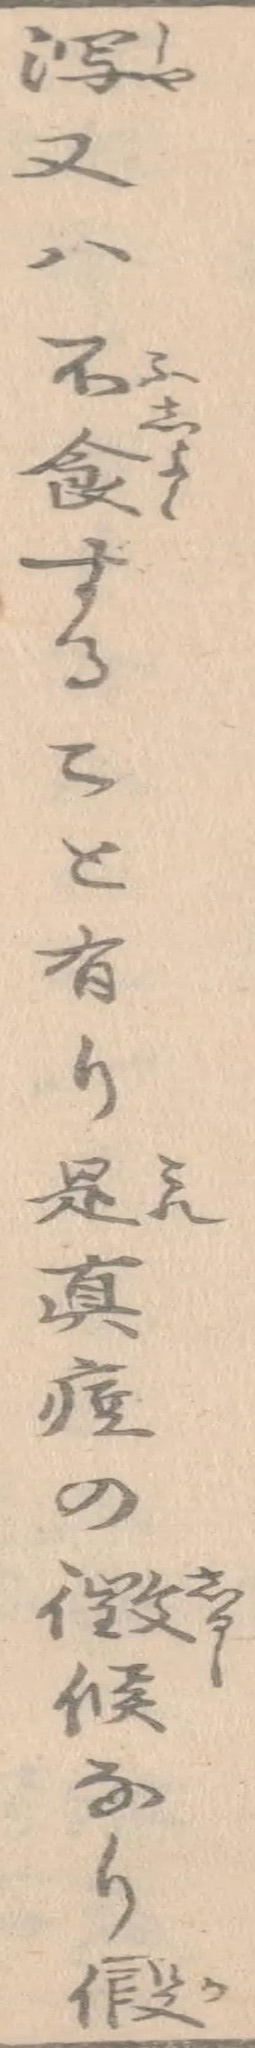瀉又は不食すること有り是真痘の徴候なり仮
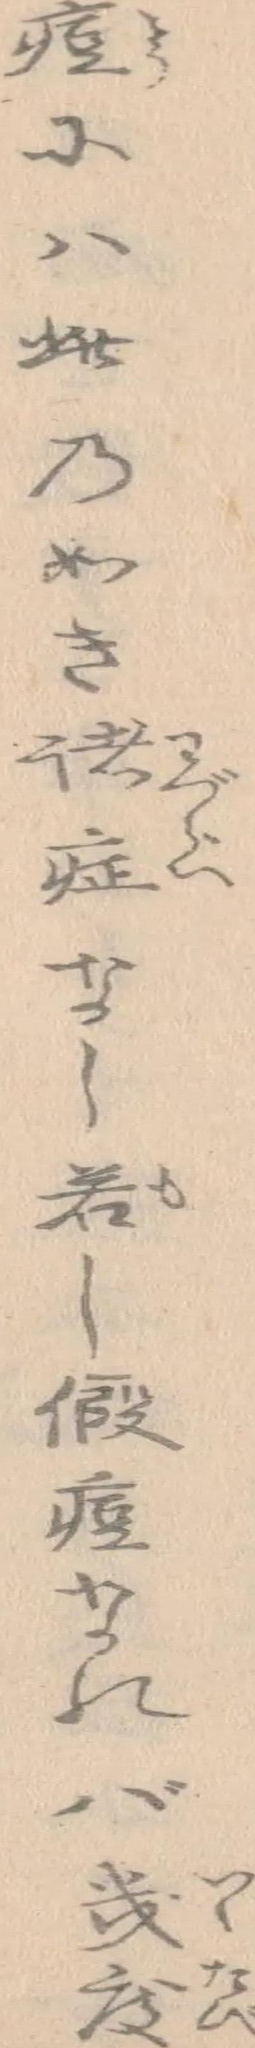痘には此の如き諸症なし若し仮痘なれば幾度
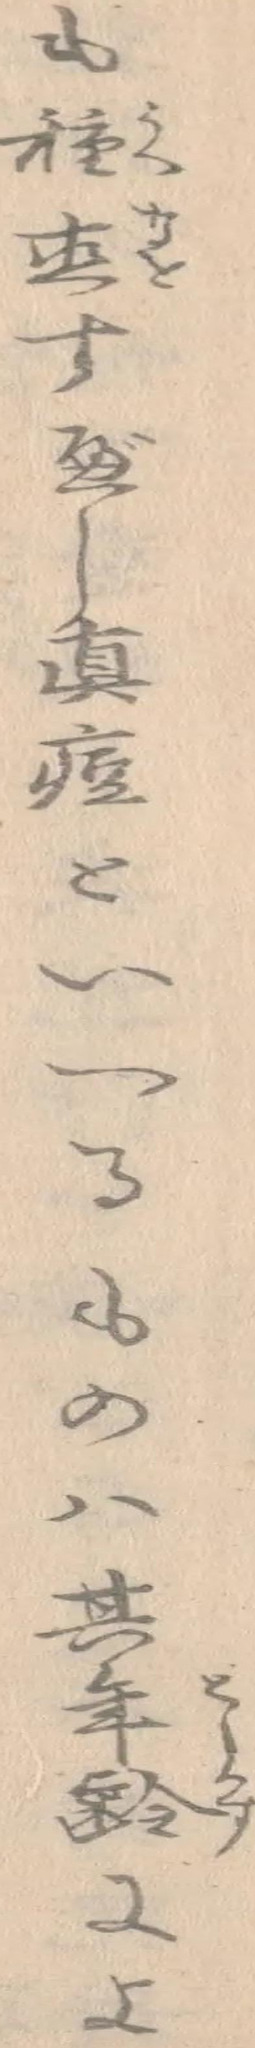も種直すべし真痘といへるものは其年齢によ
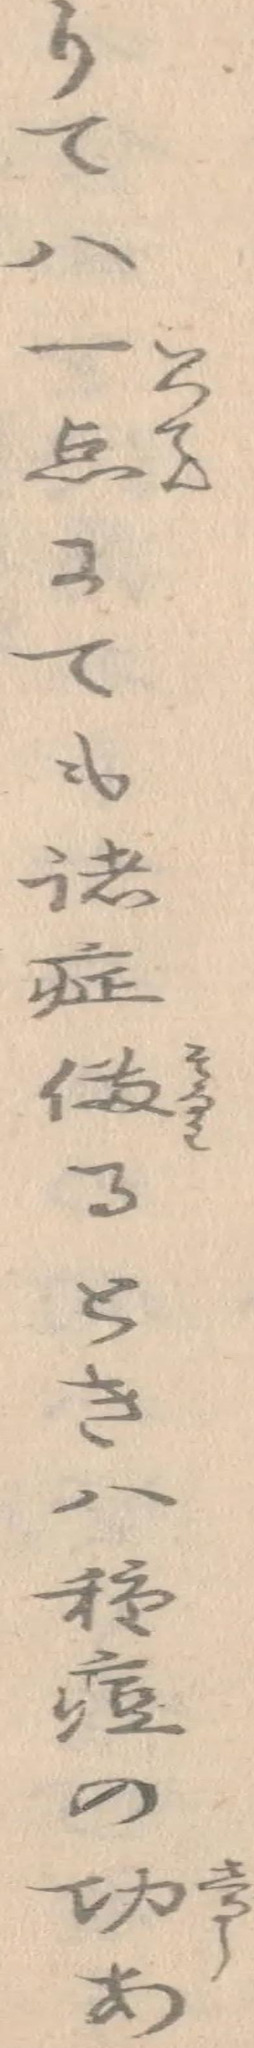りては一点まても諸症備るときは種痘の功あ
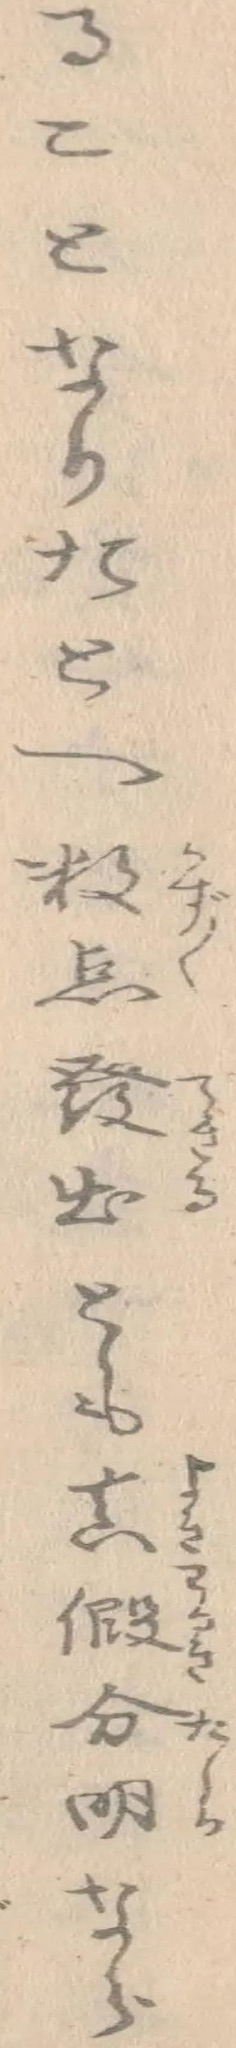ることなりたとへ数点発出とも真仮分明なら
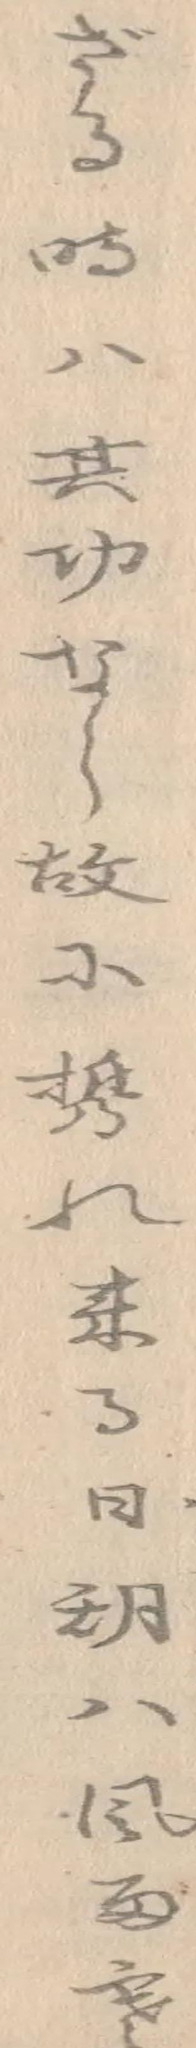ざる時は其功なし故に携れ来る日記は風雨寒
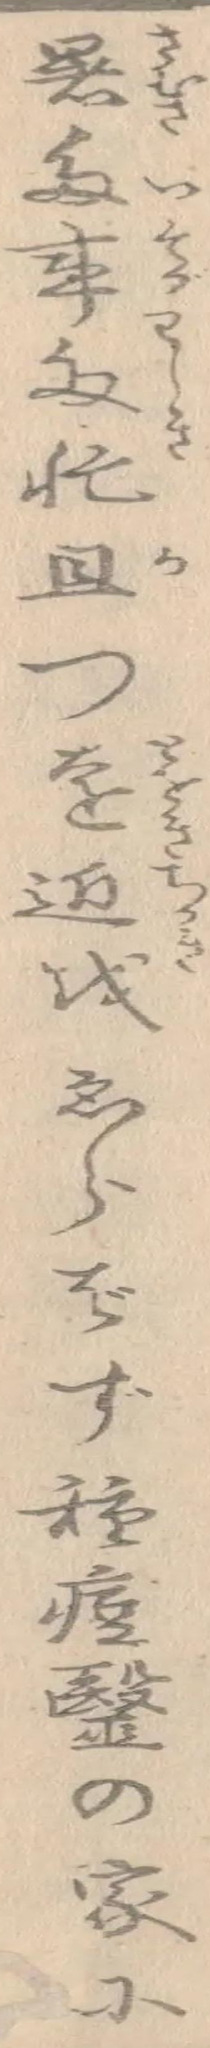暑多事匁肥且つ遠近をゑらばず種痘醫の家に
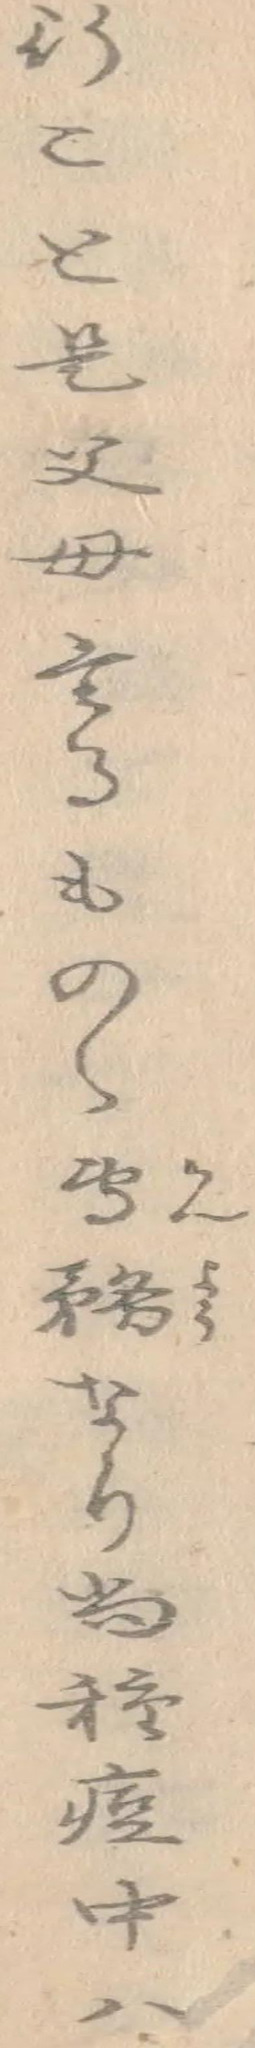行こと是父母たるものゝ専務なり尚種痘中は

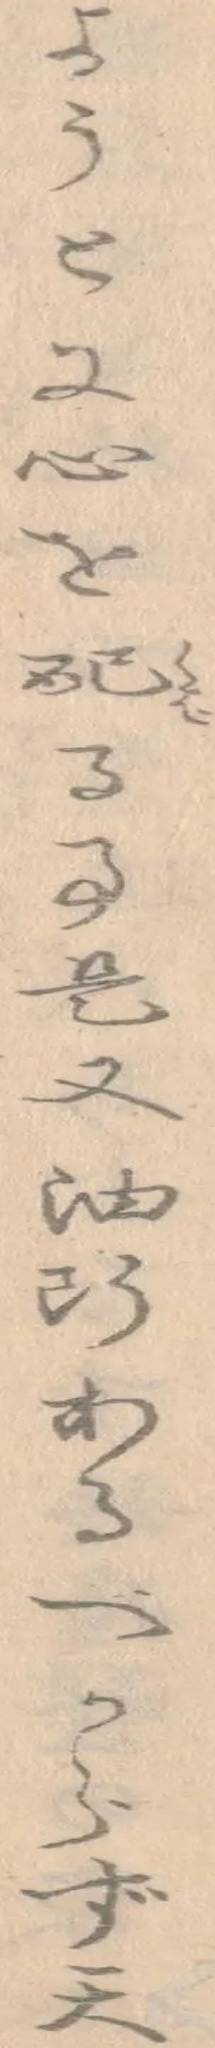ようとに心を配る事是又油断あるべからず天
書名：散花養生訓
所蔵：国立国会図書館 National Diet Library, JAPAN
